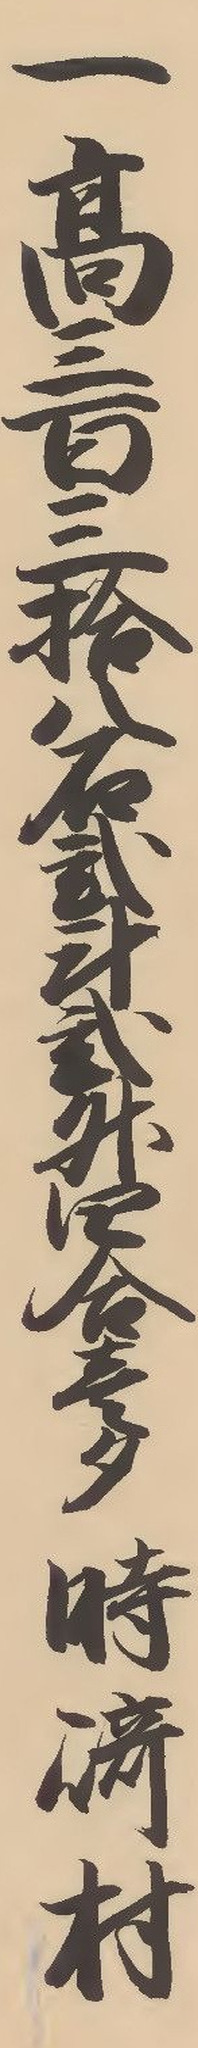一高三百三拾八石弐斗弐升四合壱勺時崎村
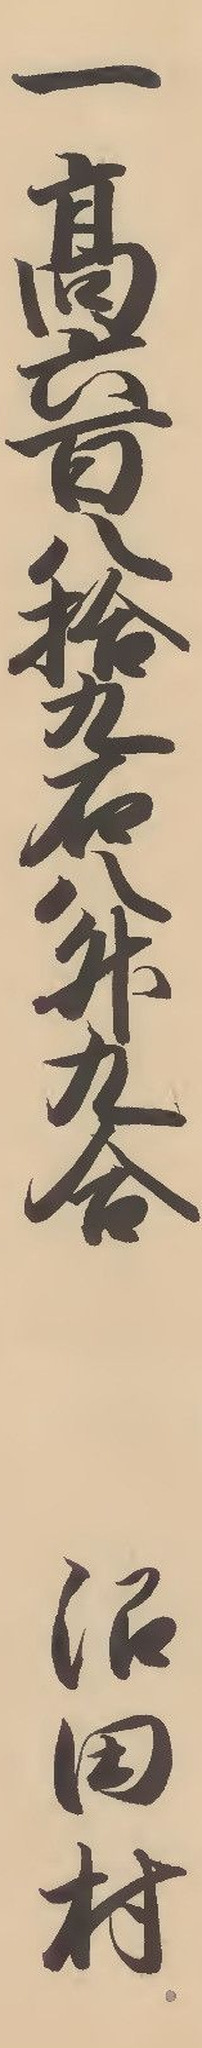一高六百八拾九石八升九合沼田村
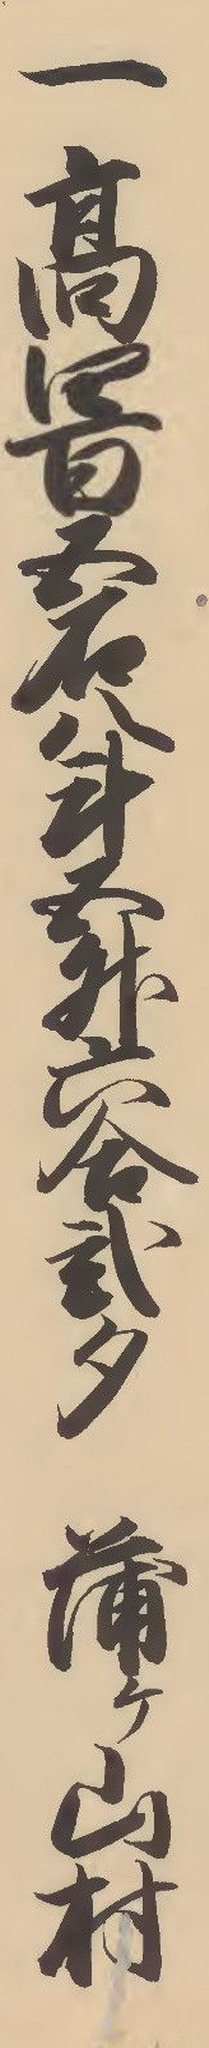一高四百五石八斗五升六合弐勺蒲ヶ山村
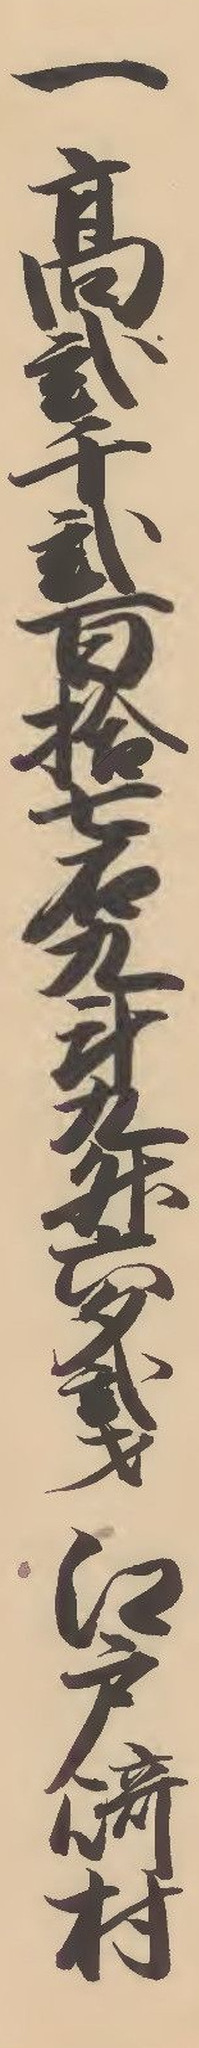一高弐千弐百拾七石九斗九升六勺弐才江戸崎村

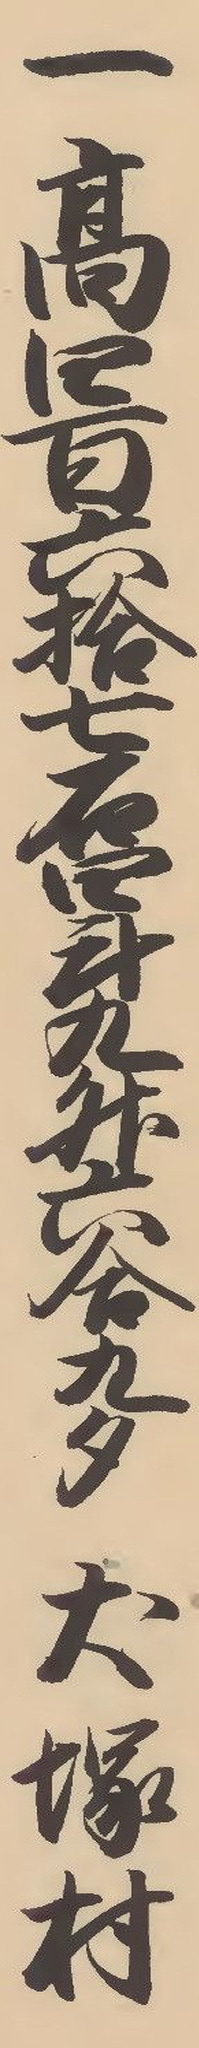一高四百六拾七石四斗九升六合九勺犬塚村
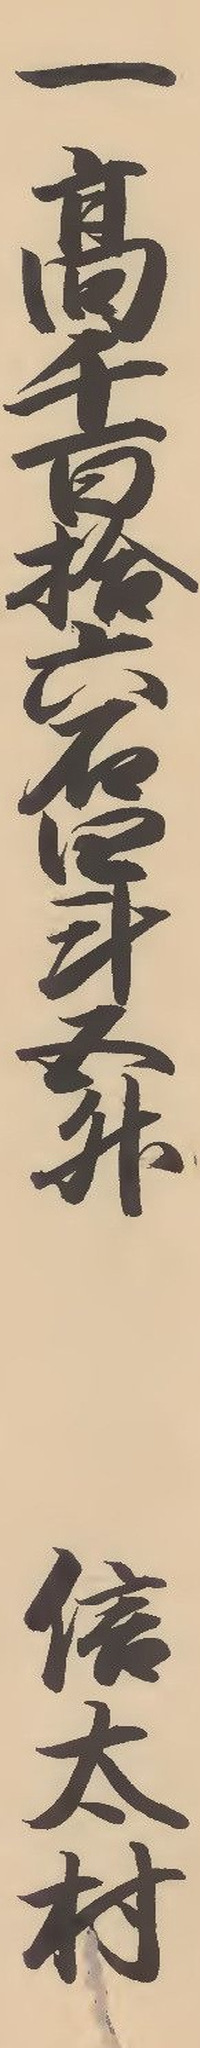一高千百拾六石四斗五升信太村
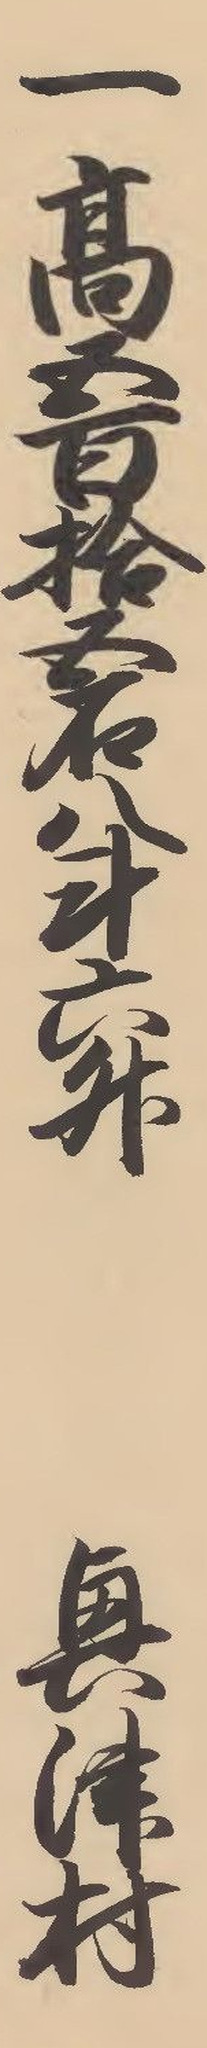一高五百拾五石八斗六升興津村
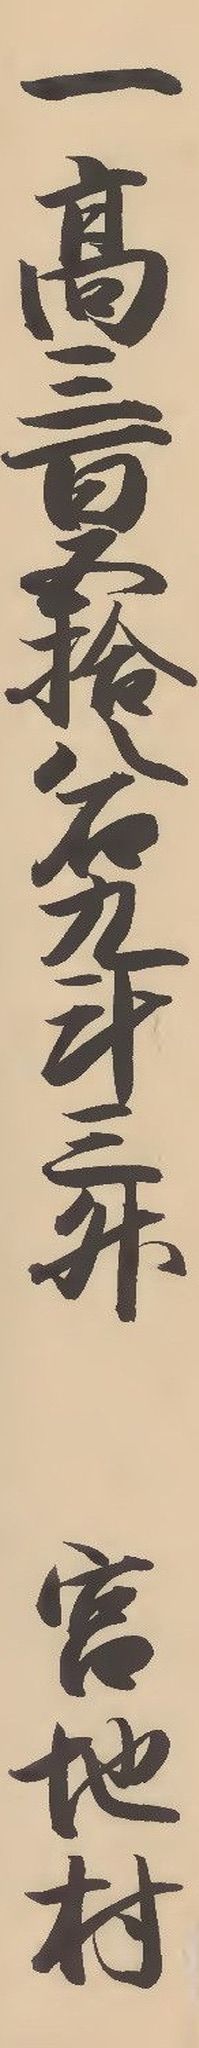一高三百五拾八石九斗三升宮地村
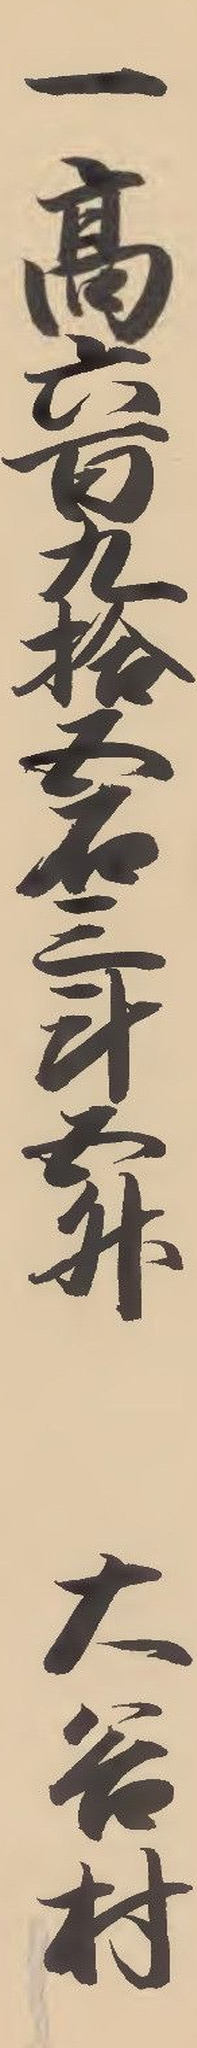一高六百九拾五石三斗五升大谷村
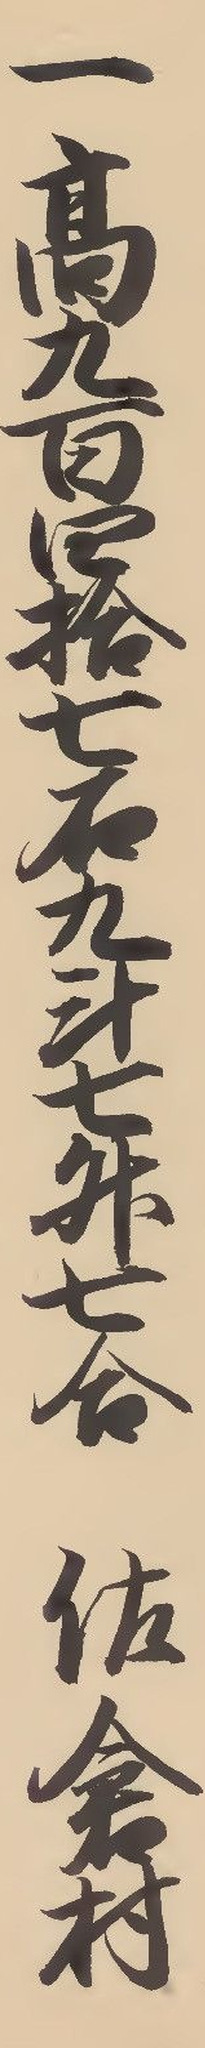一高九百四拾七石九斗七升七合佐倉村
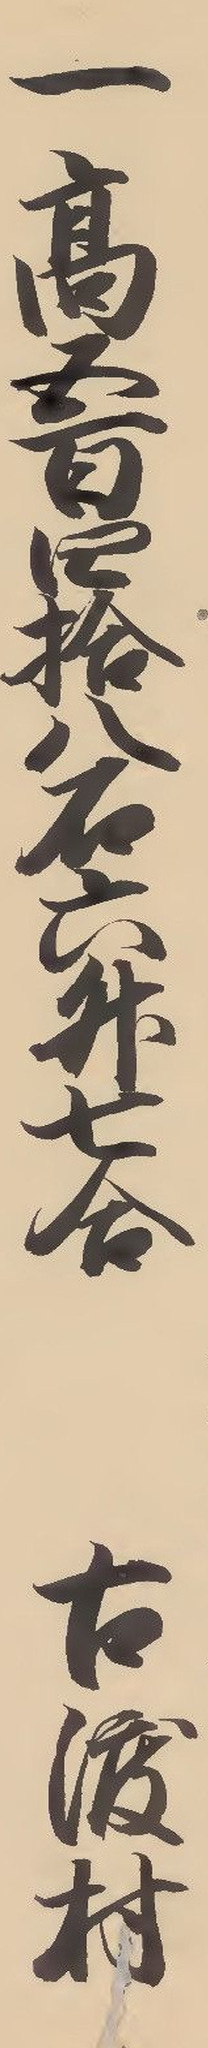一高五百四拾八石六升七合古渡村
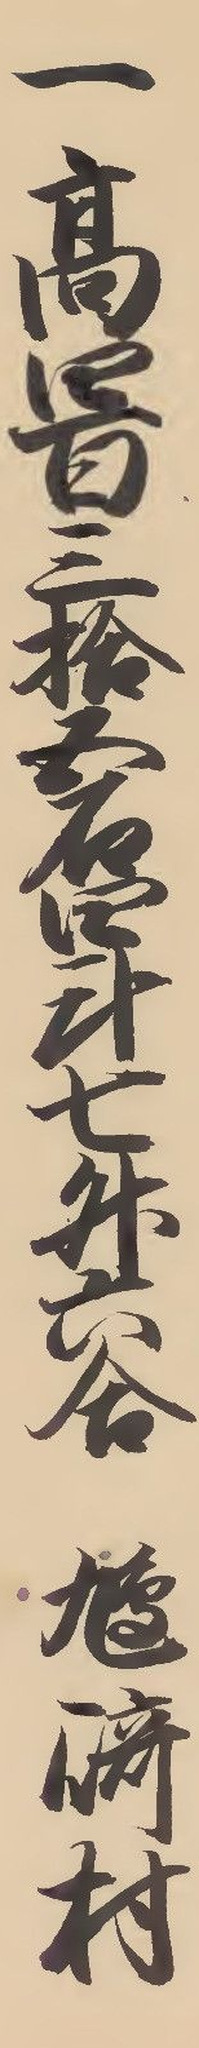一高四百三拾五石四斗七升六合鳩崎村

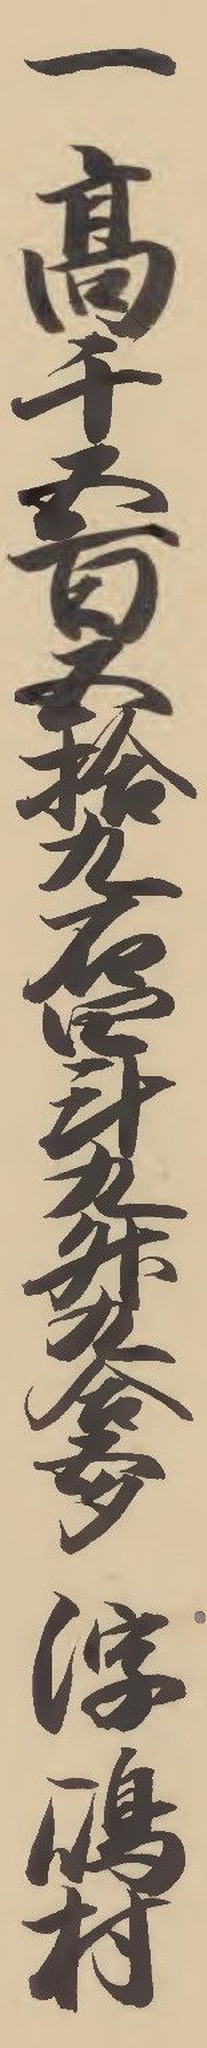一高千五百五拾九石四斗九升九合五勺浮島村
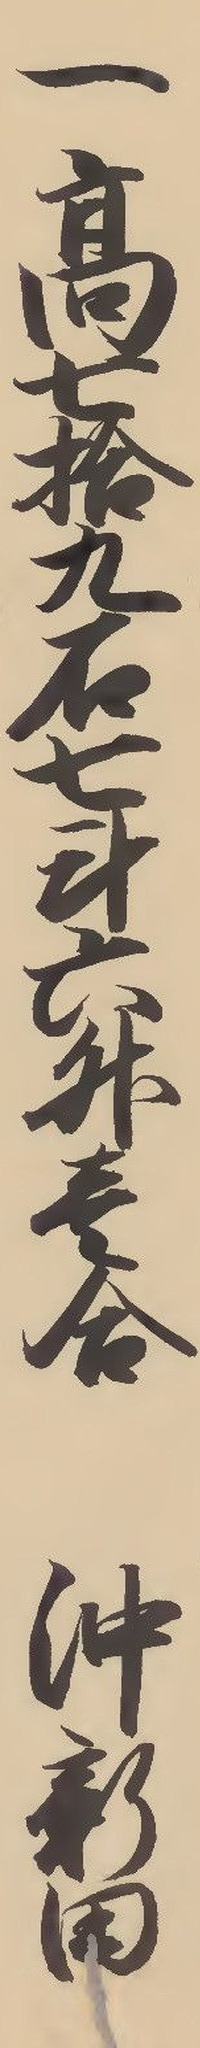一高七拾九石七斗六升壱合沖新田
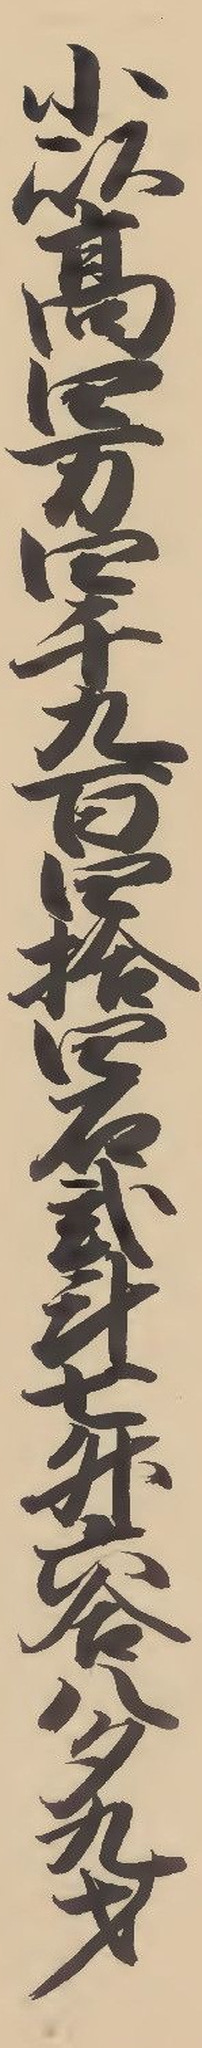小以高四万四千九百四拾四石弐斗七升六合八勺九才
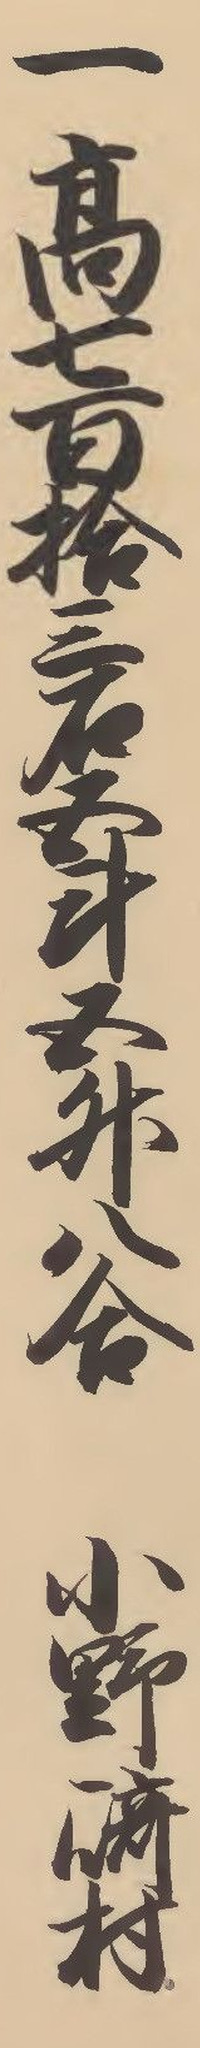一高七百拾三石五斗五升八合小野崎村
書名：常陸国郷帳
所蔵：国立公文書館 National Archives of Japan
